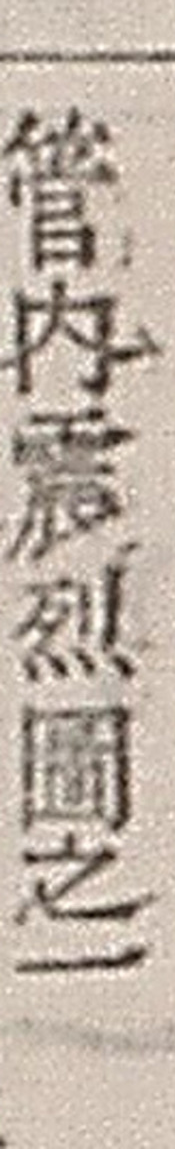管内震烈図之一
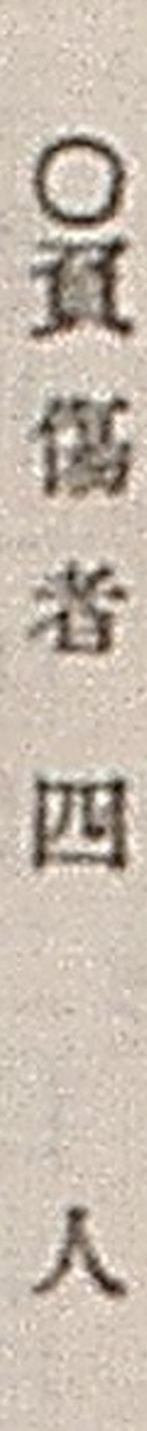〇負傷者四人
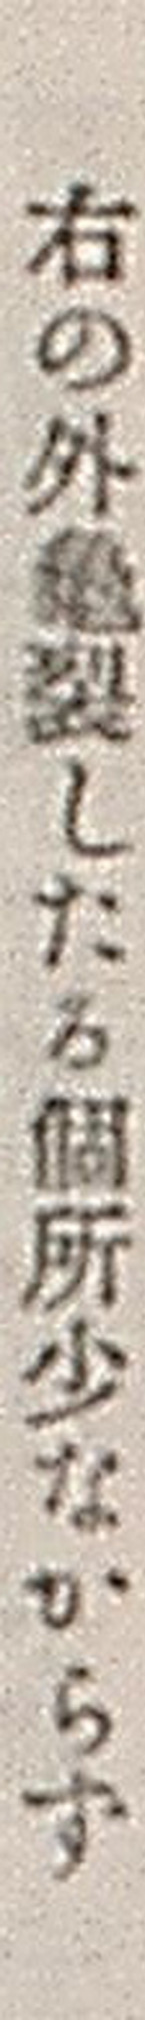右の外亀裂したる個所少なからず
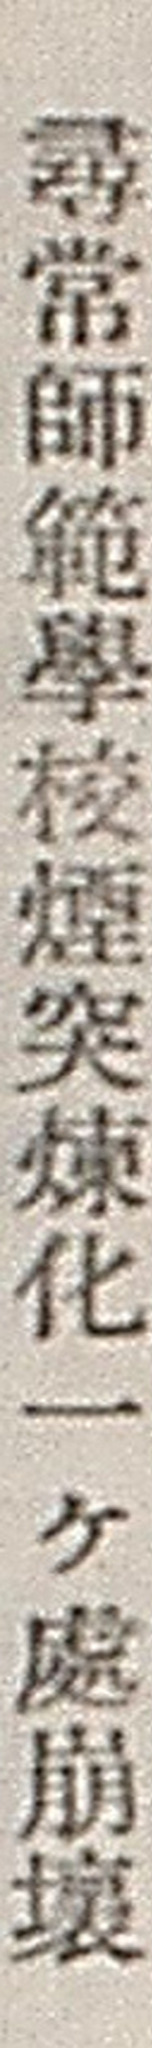尋常師範学校煙突煉化一ヶ処崩壊
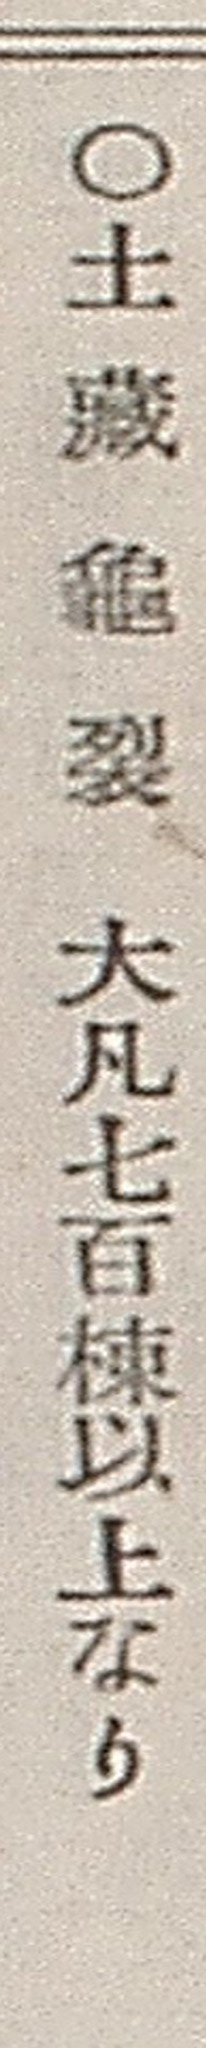〇土蔵亀裂大凡七百棟以上なり
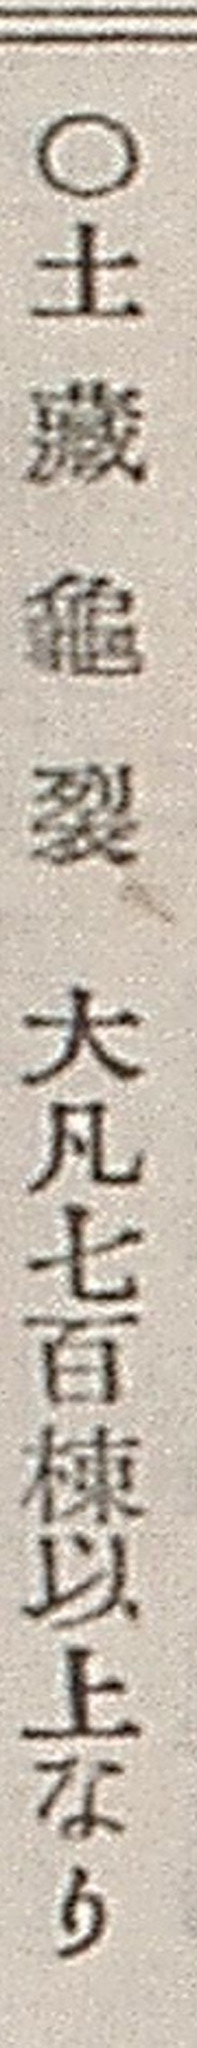〇土蔵亀裂大凡七百棟以上なり
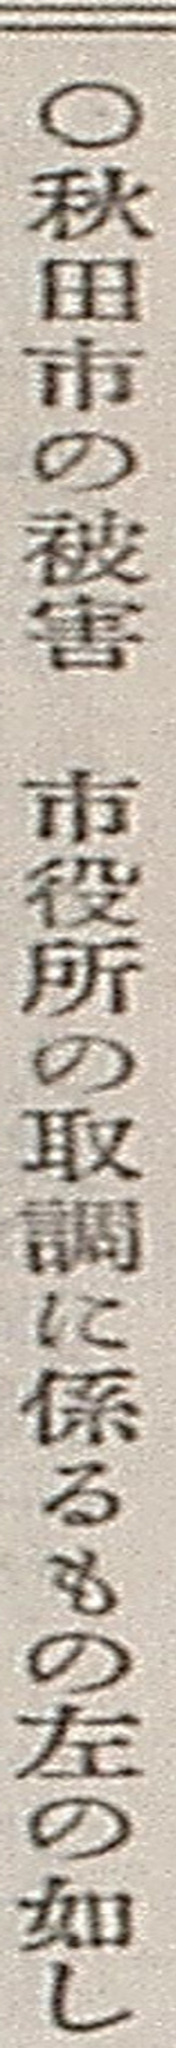〇秋田市の被害市役所の取調に係るもの左の如し
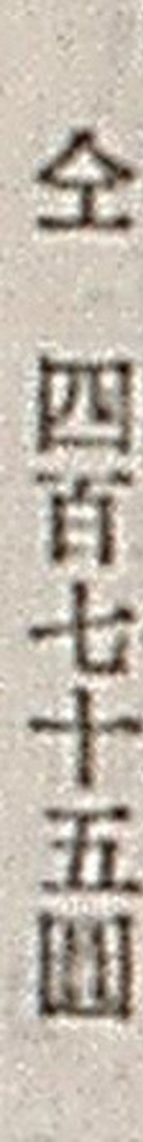仝四百七十五円
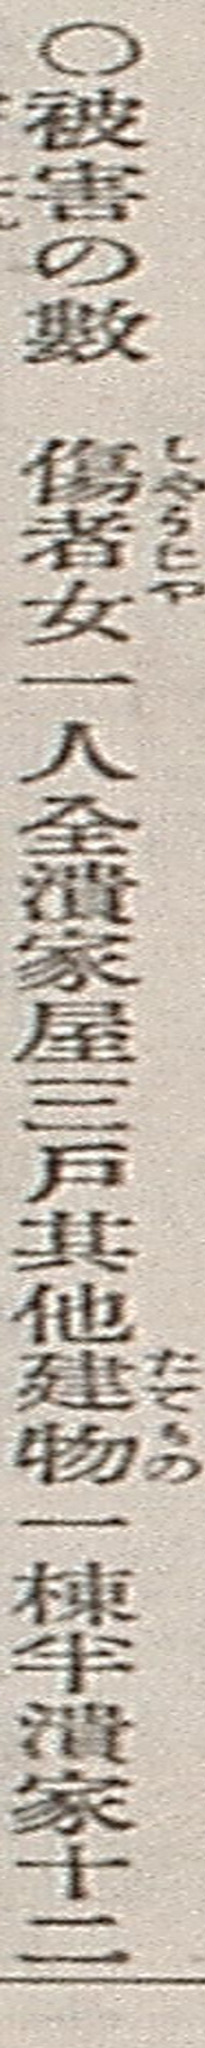〇被害の数傷者女一人全潰家屋三戸其他建物一棟半潰家十二
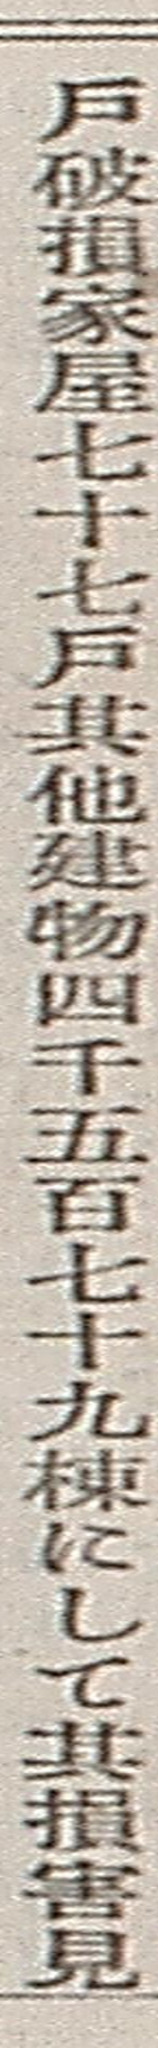戸破損家屋七十七戸其他建物四千五百七十九棟にして其損害見
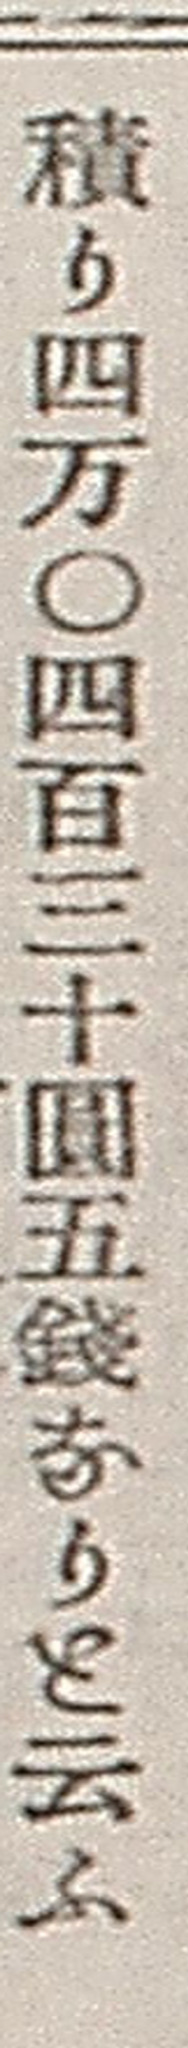積り四万〇四百三十円五銭なりと云ふ
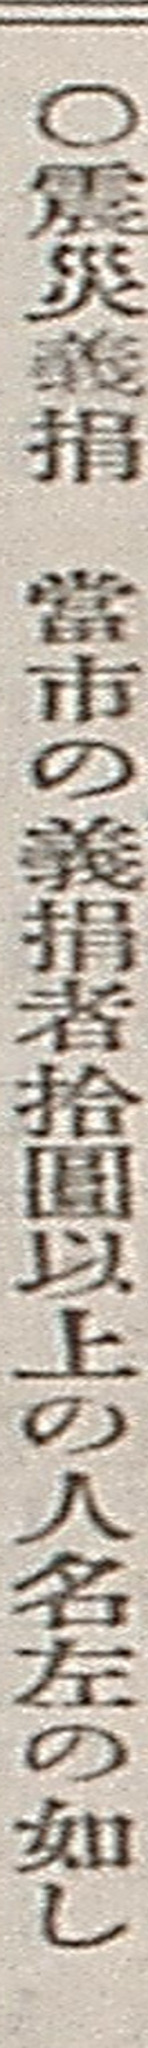〇震災義捐当市の義捐者拾円以上の人名左の如し
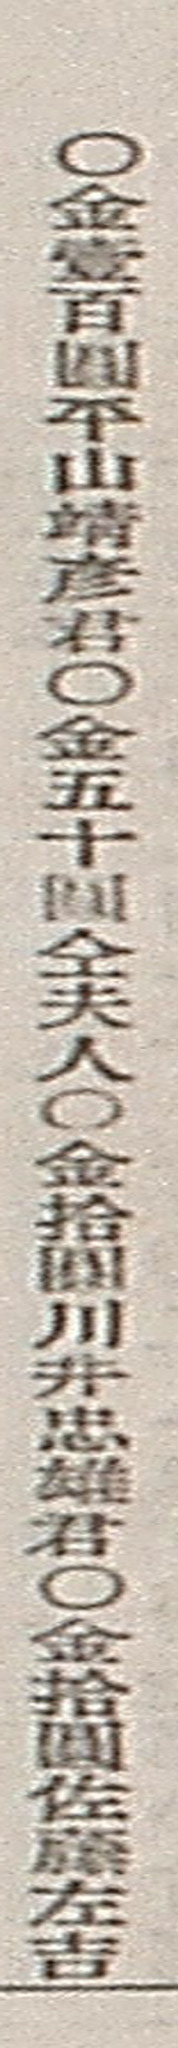〇金壱百円平山靖彦君〇金五十円仝夫人〇金拾円川井忠雄君〇金拾円佐藤左吉
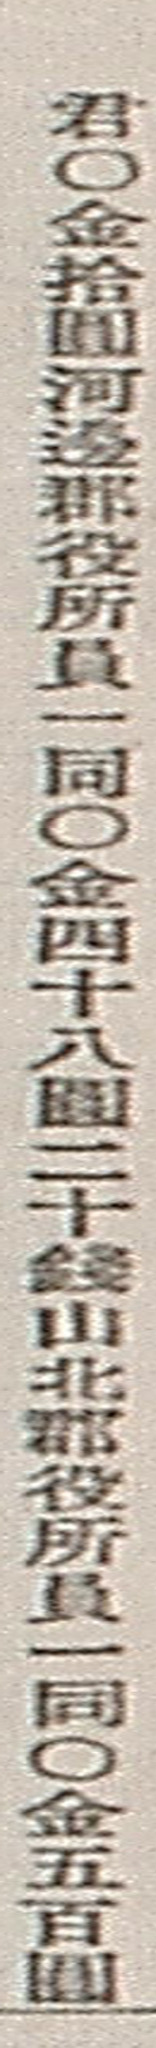君〇金拾円河辺郡役所員一同〇金四十八円二十銭山北郡役所員一同〇金五百円
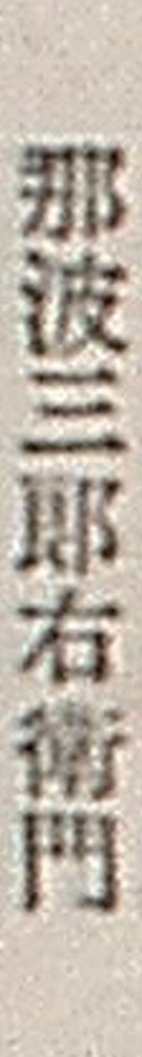那波三郎右衛門

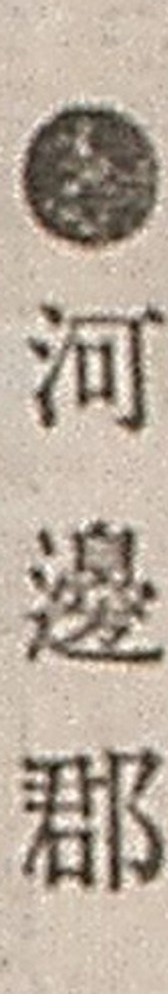●河辺郡
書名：風俗畫報臨時増刊第百二十四號　洪水地震被害録（上）
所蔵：東京大学地震研究所図書室 Earthquake Research Institute Library, The University of Tokyo, JAPAN
